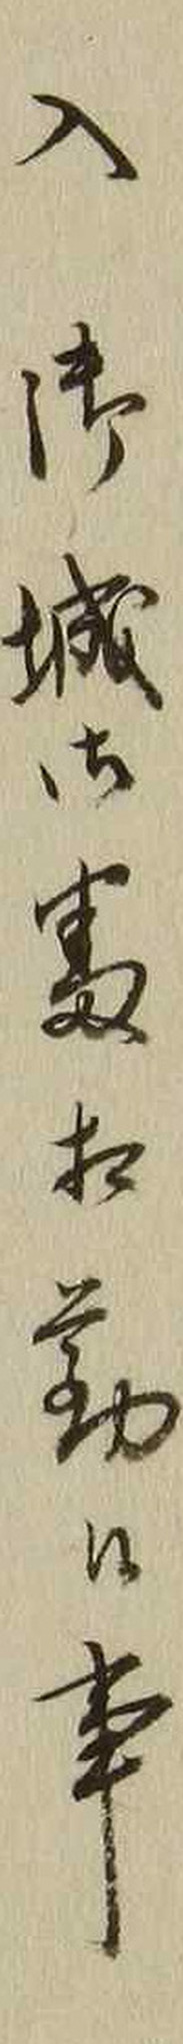入御城御番相勤候事
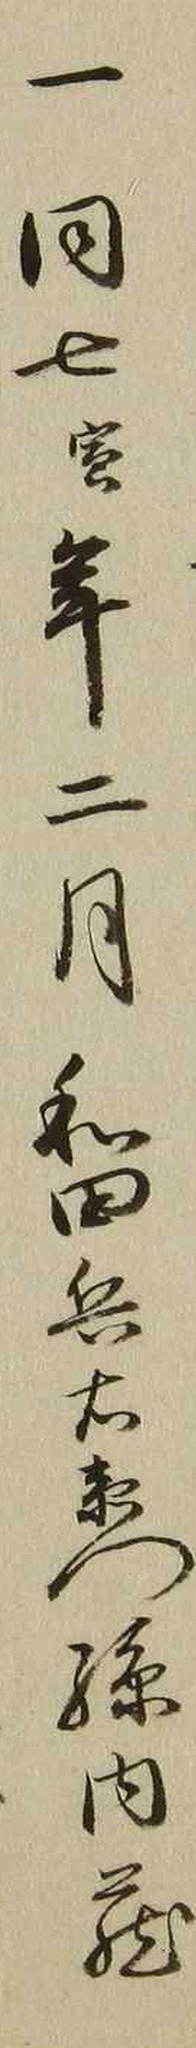一同七寅年二月和田兵右衛門孫内蔵
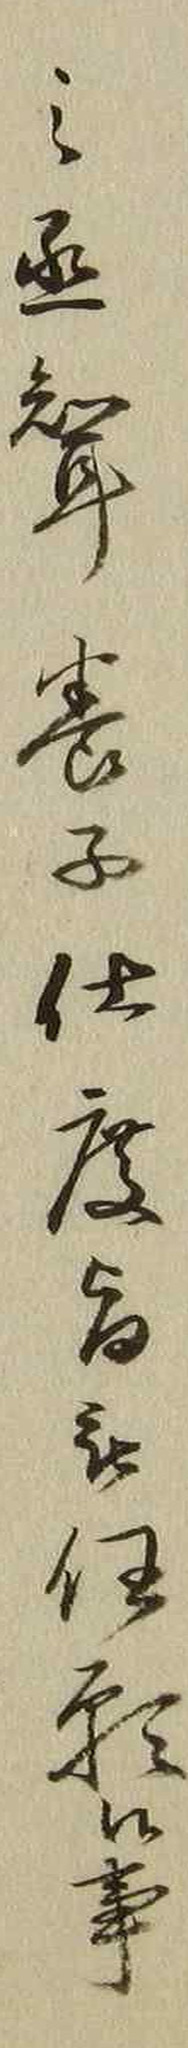之丞聟養子仕度旨被任願候事
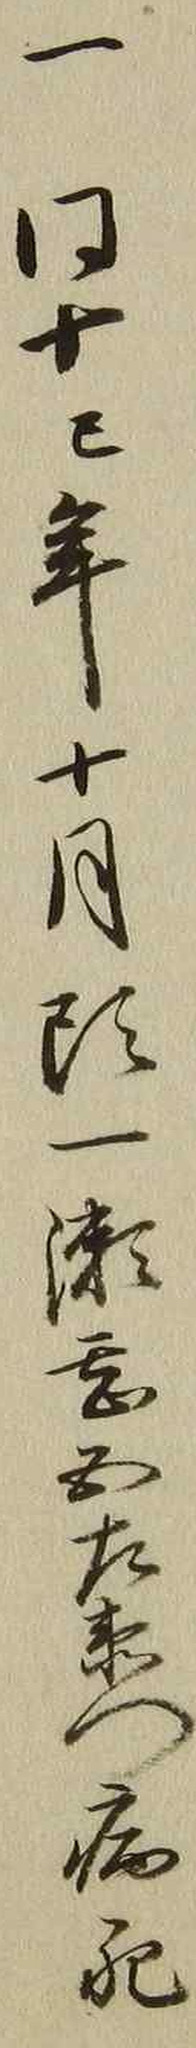一同十巳年十月頭一瀬甚五左衛門病死
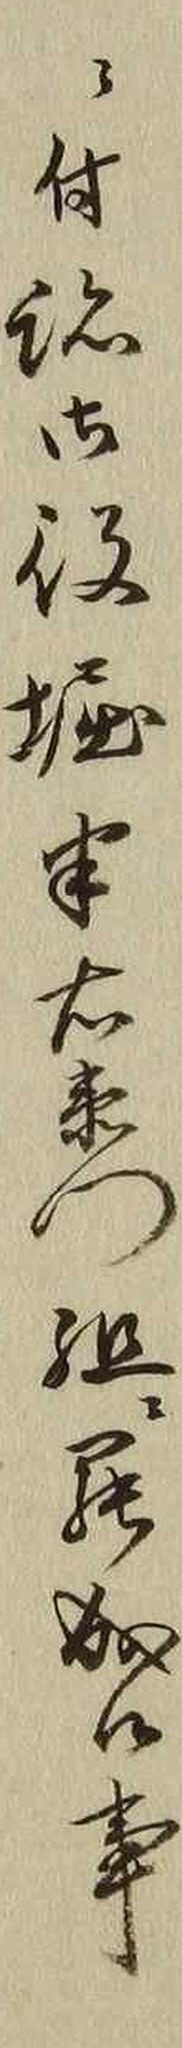ニ付跡御役堀半右衛門組ニ罷成候事
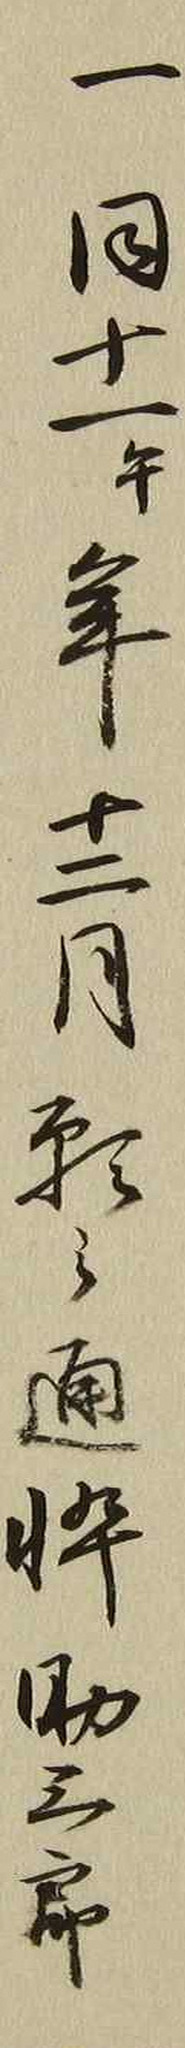一同十一午年十二月願之通忰助三郎
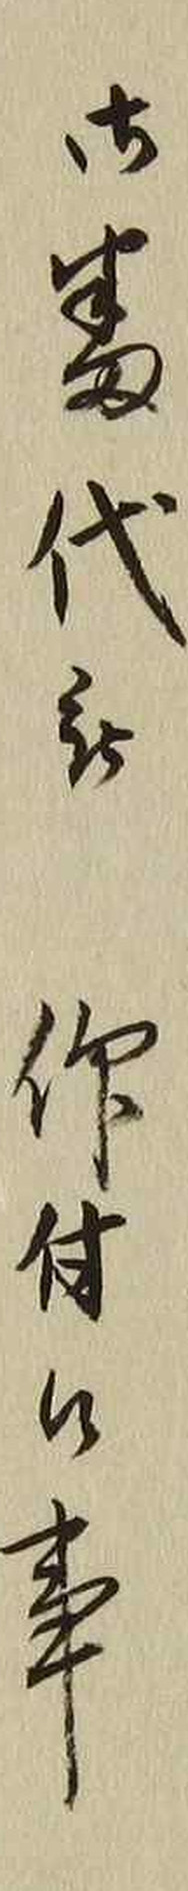御番代被仰付候事
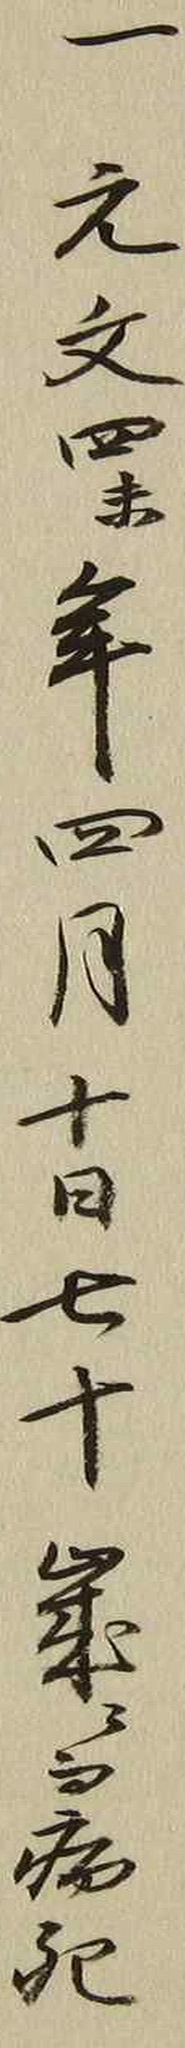一元文四未年四月十日七十歳ニ而病死
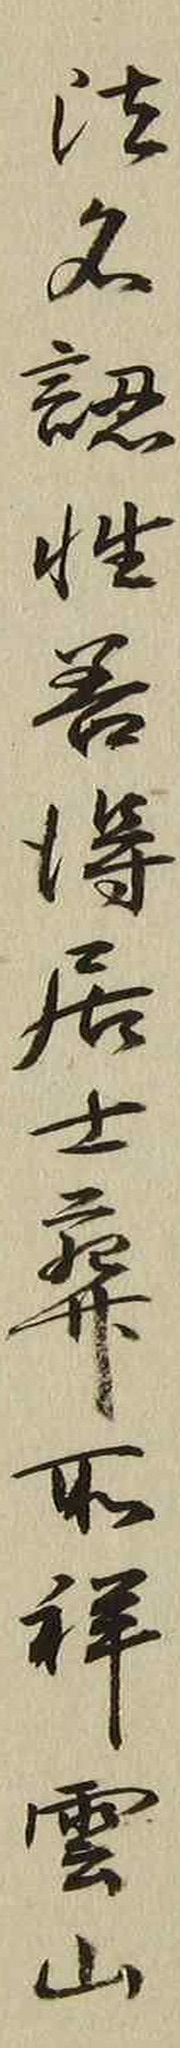法名認性善得居士葬所祥雲山
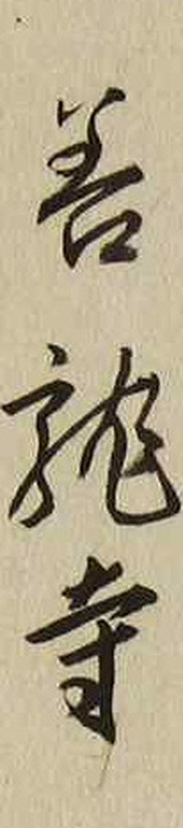善龍寺
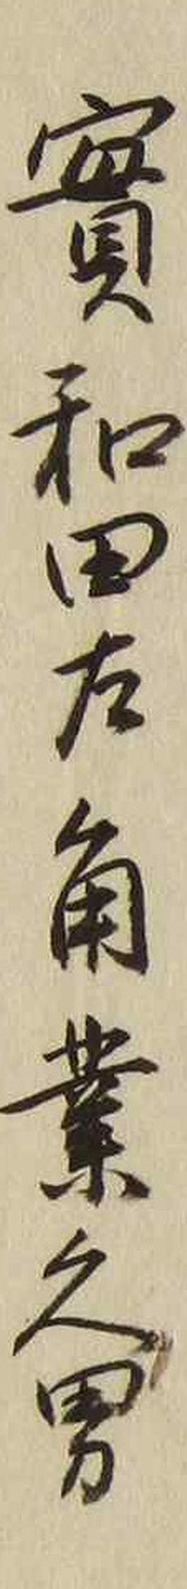実和田左角業久男

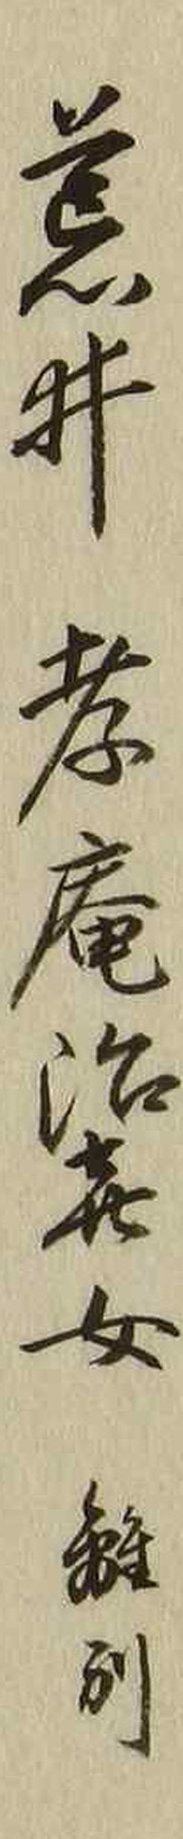荒井孝庵治喜女離別
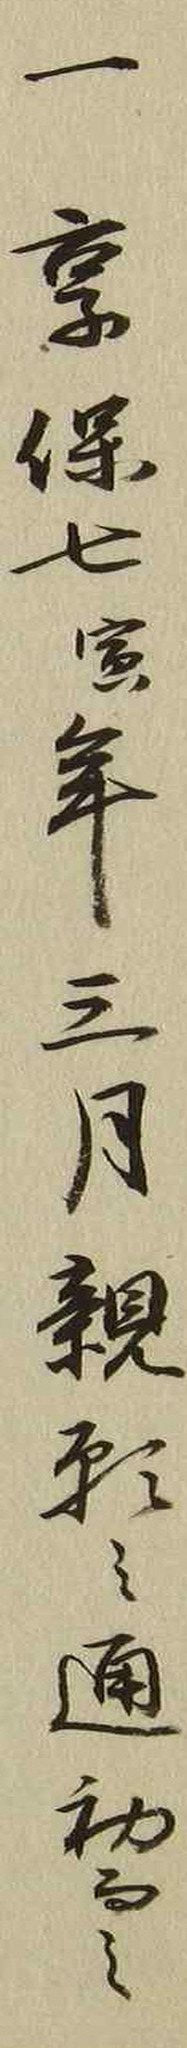一享保七寅年三月親願之通初而之
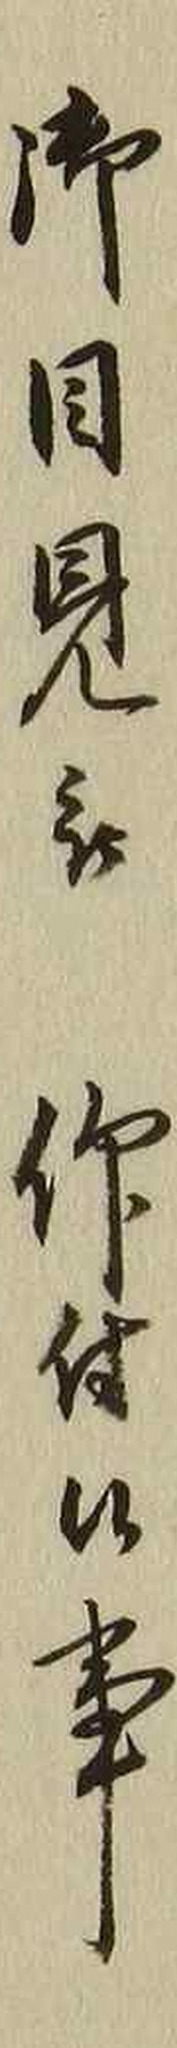御目見被仰付候事
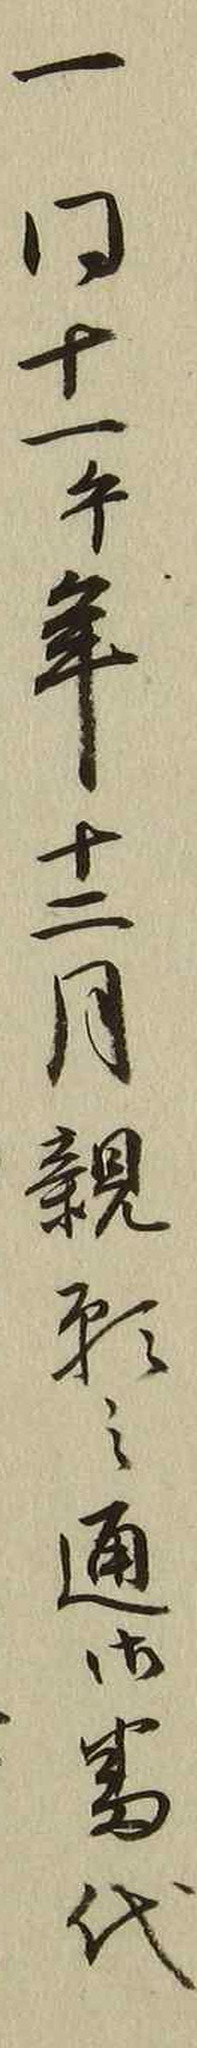一同十一午年十二月親願之通御番代
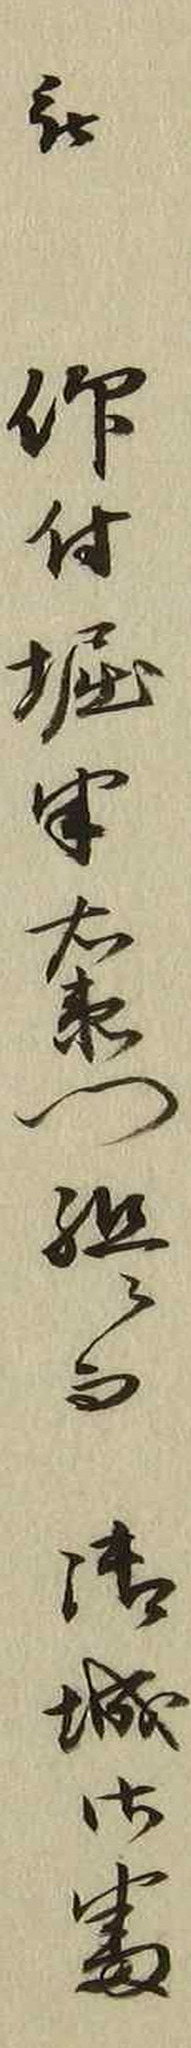被仰付堀半右衛門組ニ而御城御番
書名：諸士系譜　巻之128　た之部4
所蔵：会津若松市立会津図書館
